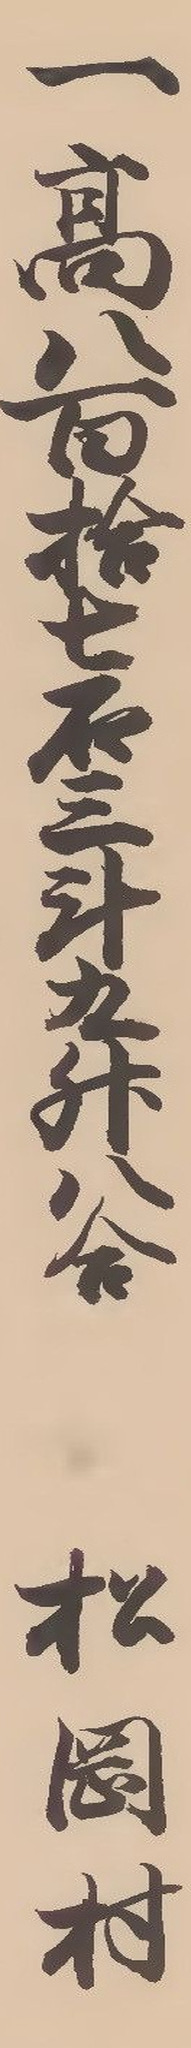一高八百拾七石三斗九升八合松岡村
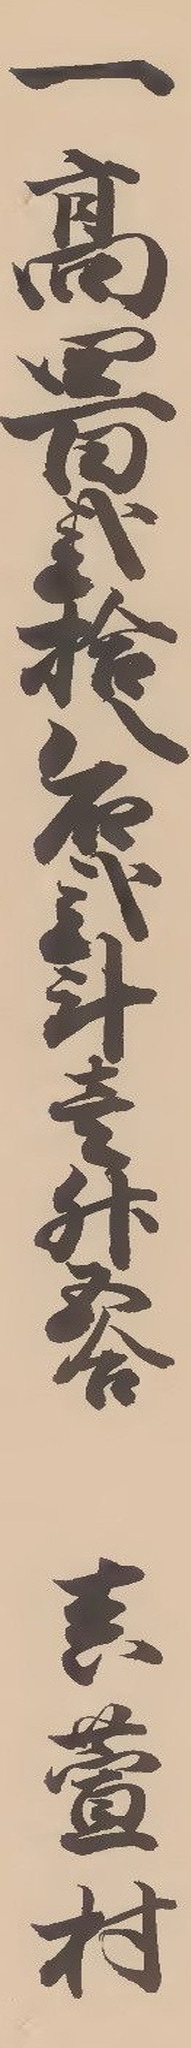一高四百弐拾八石弐斗壱升五合真萱村
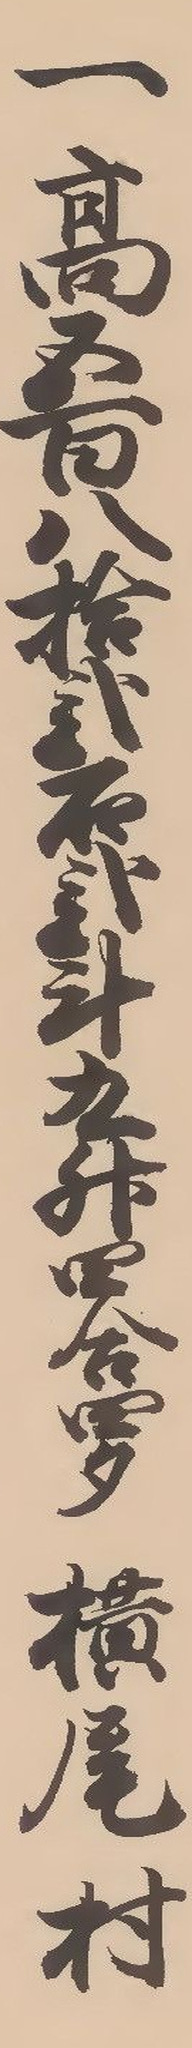一高五百八拾弐石弐斗九升四合四勺横尾村
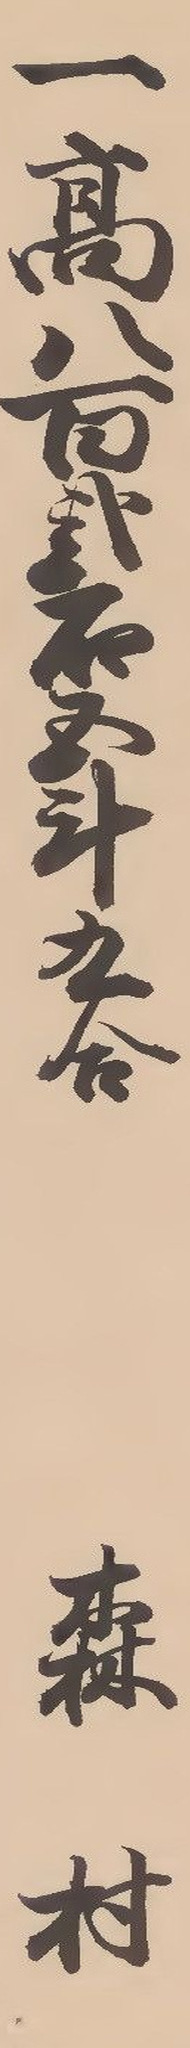一高八百弐石五斗九合森村
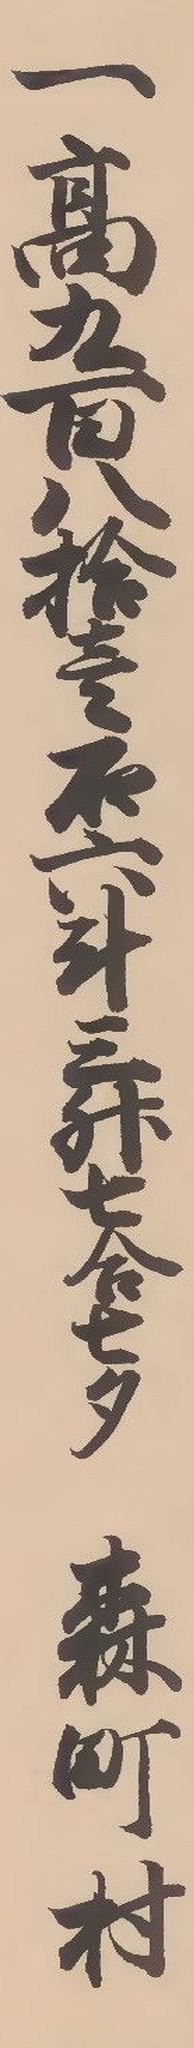一高九百八拾壱石六斗三升七合七勺森町村
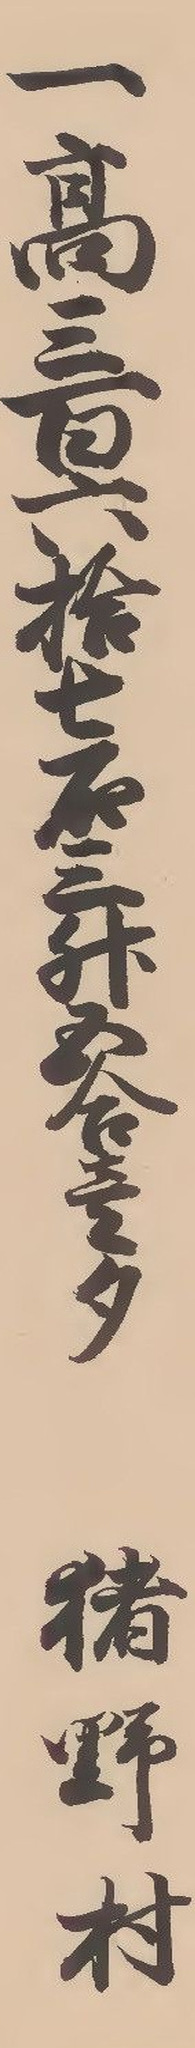一高三百六拾七石三升五合壱勺猪野村
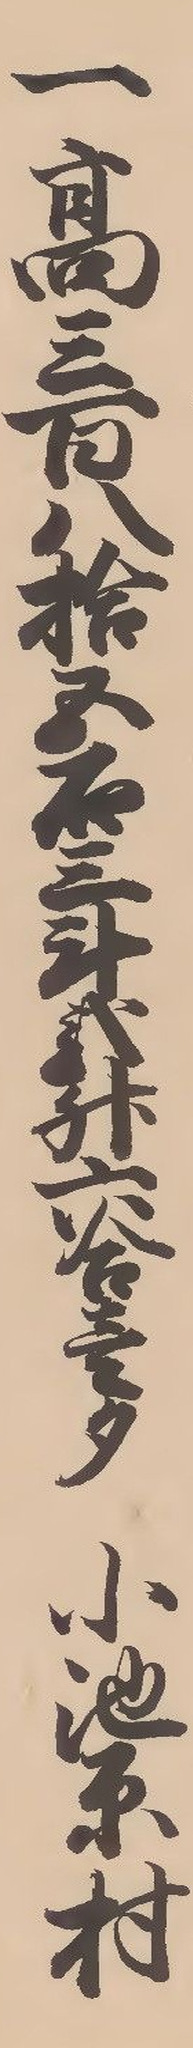一高三百八拾五石三斗弐升六合壱勺小池原村
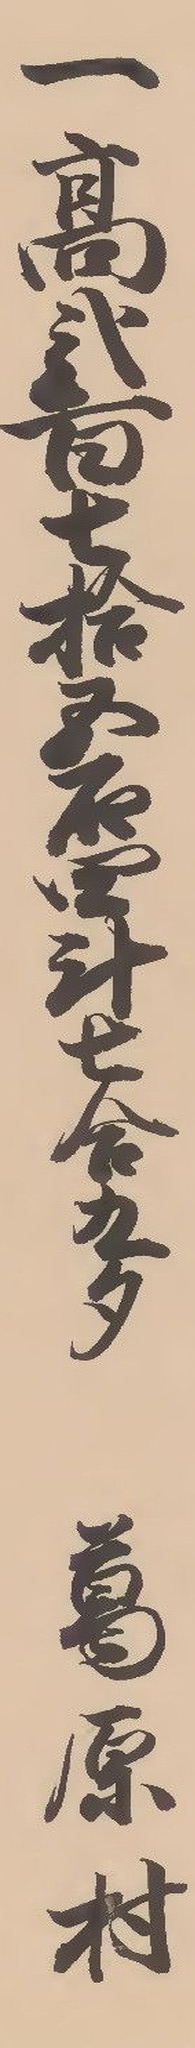一高弐百七拾五石四斗七合九勺葛原村

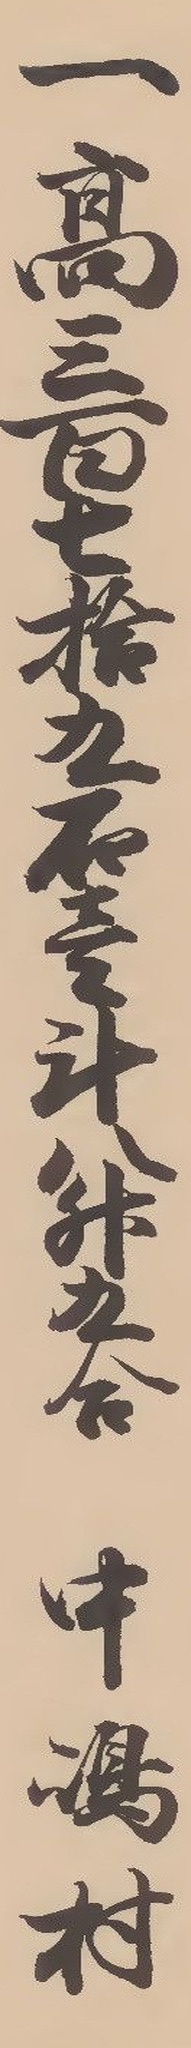一高三百七拾九石壱斗八升九合中島村
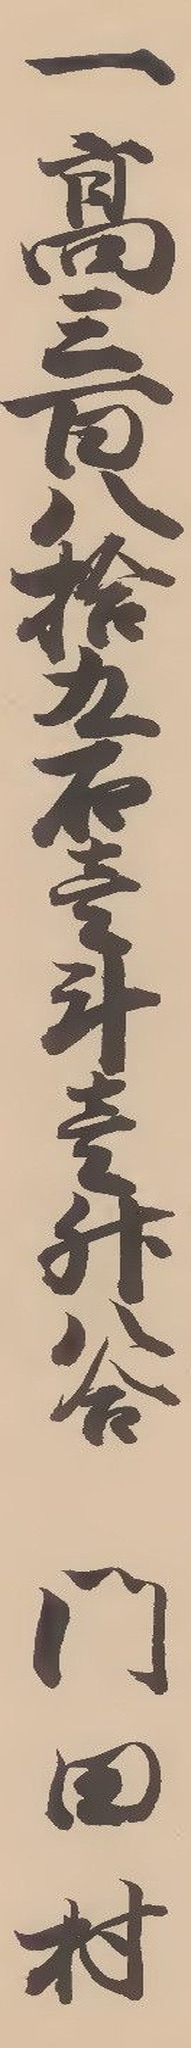一高三百八拾九石壱斗壱升八合門田村
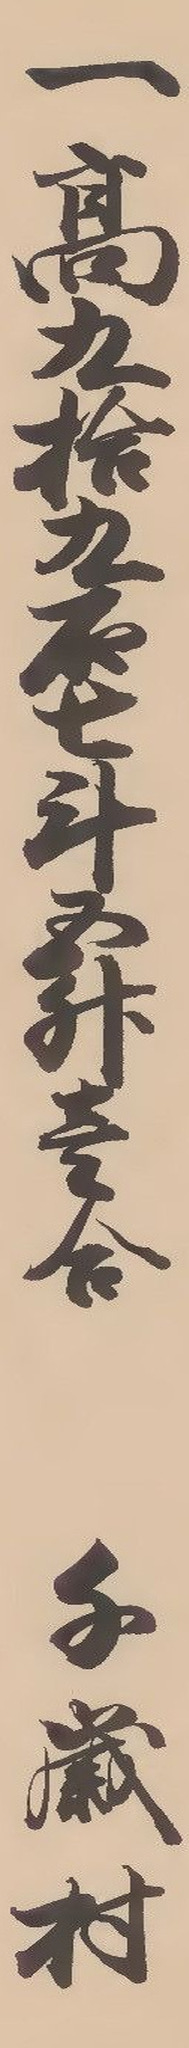一高九拾九石七斗五升壱合千歳村
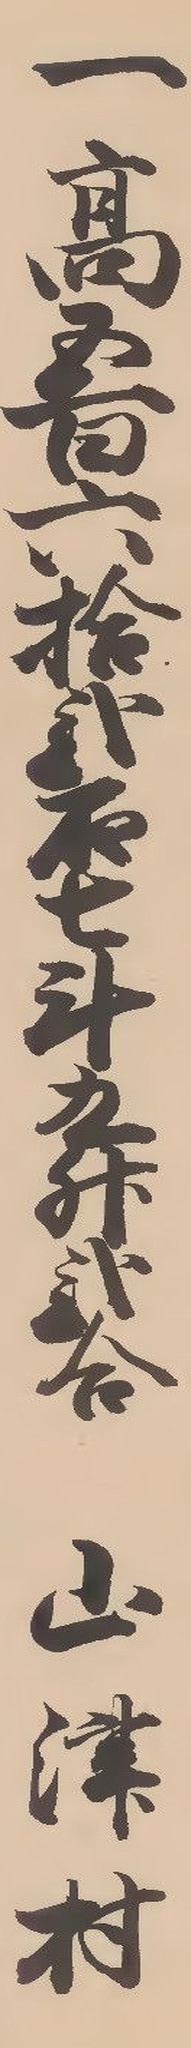一高五百六拾弐石七斗九升弐合山津村
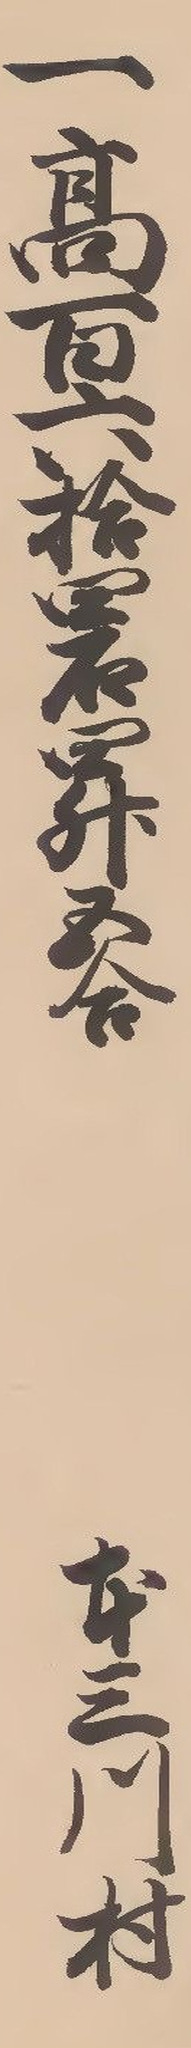一高百六拾四石四升五合本三川村
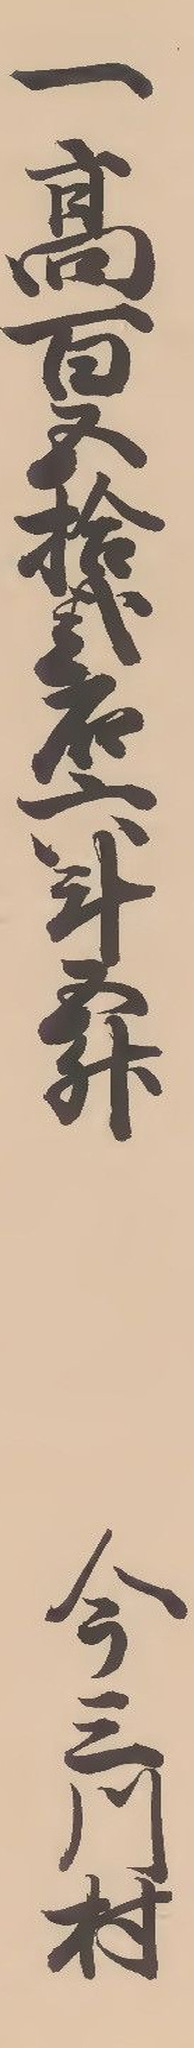一高百五拾弐石六斗五升今三川村
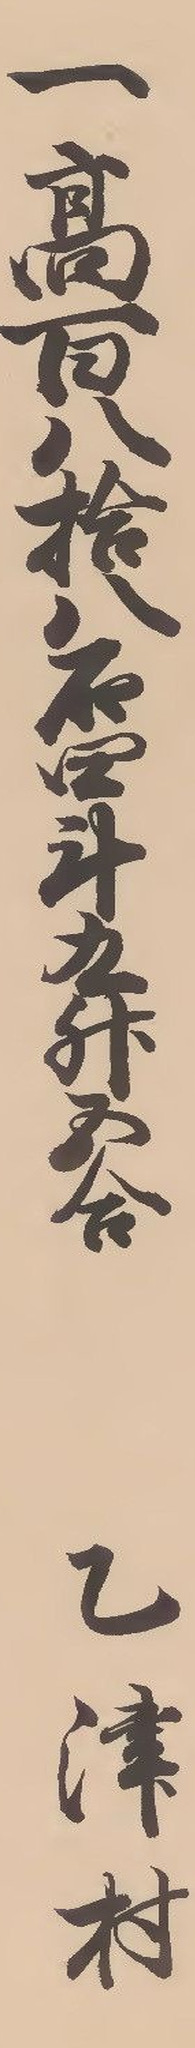一高百八拾八石四斗九升五合乙津村
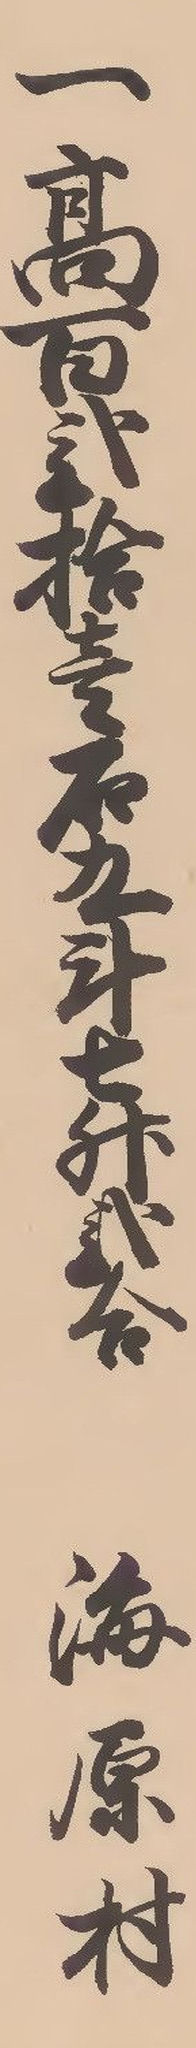一高百弐拾壱石九斗七升弐合海原村
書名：豊後国郷帳
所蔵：国立公文書館 National Archives of Japan
